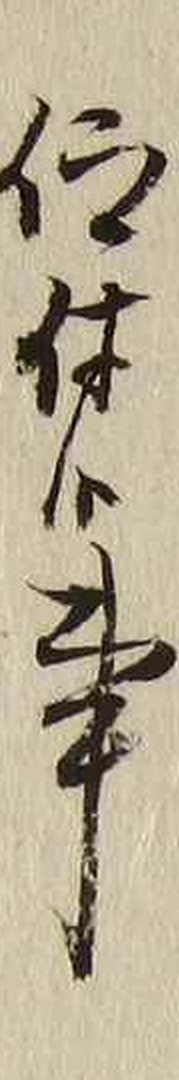仰付候事
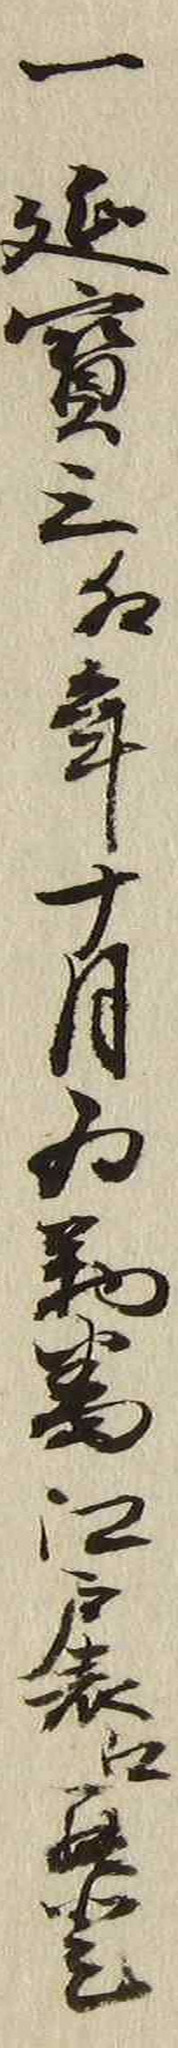一延宝三卯年十月為勤番江戸表江罷登
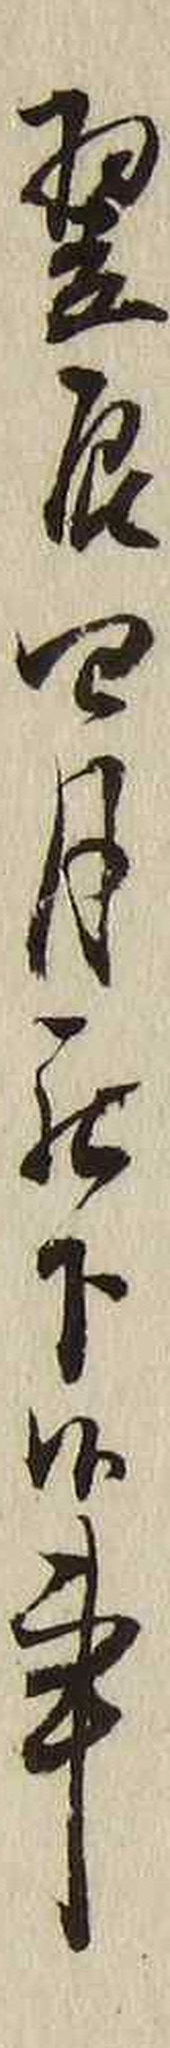翌辰四月罷下候事
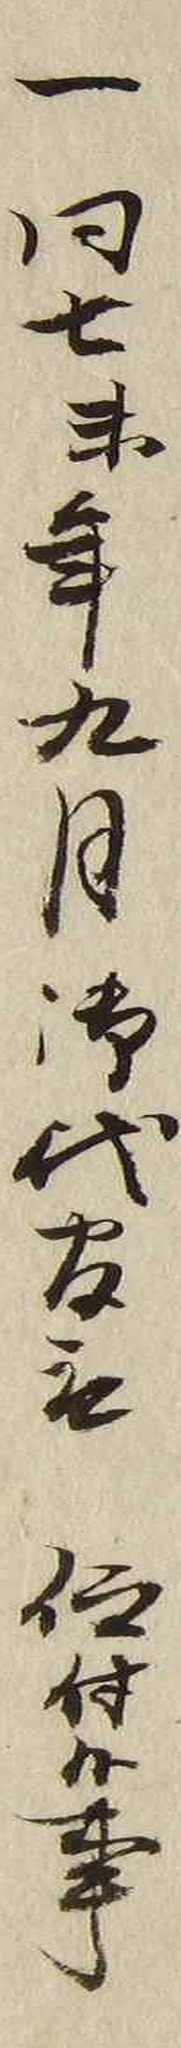一同七未年九月御代官被仰付候事
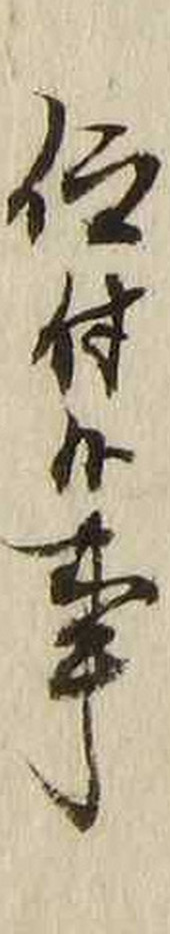仰付候事

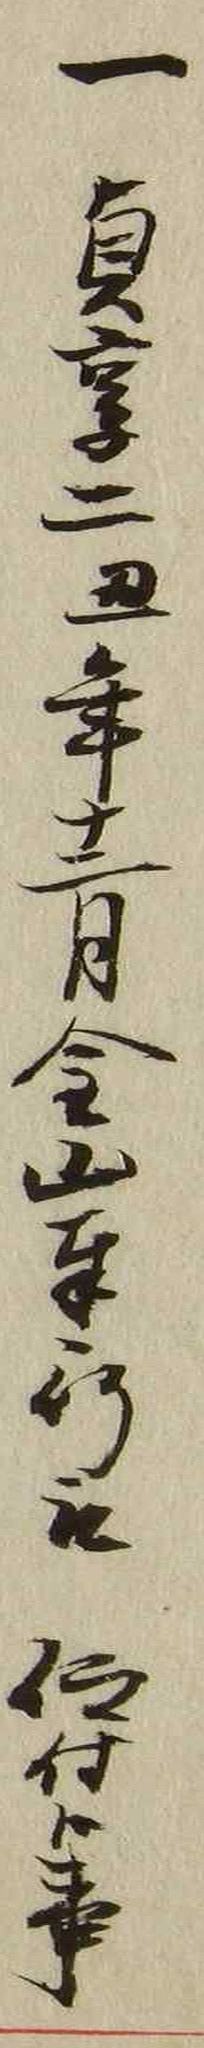一貞享二丑年十二月金山奉行被仰付候事
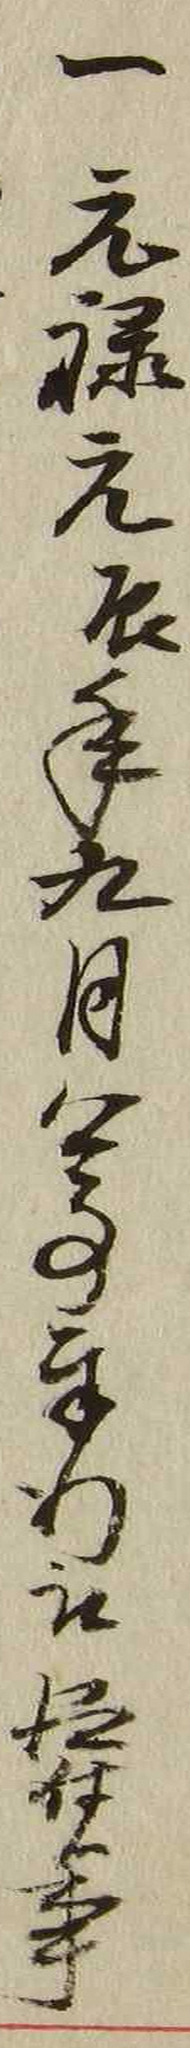一元禄元辰年九月公事奉行被仰付候事
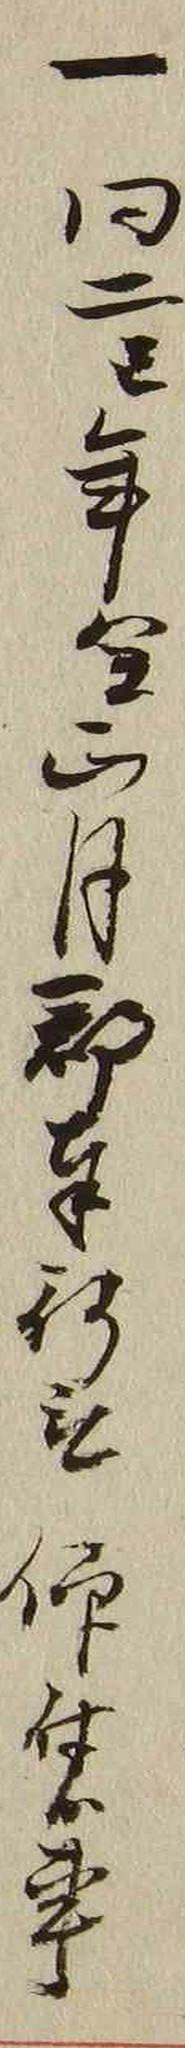一同二巳年閏正月郡奉行被仰付候事
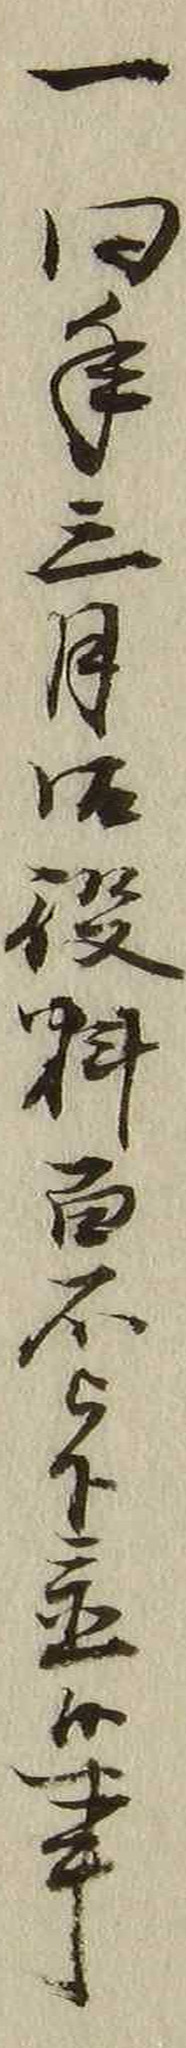一同年三月御役料百石被下置候事
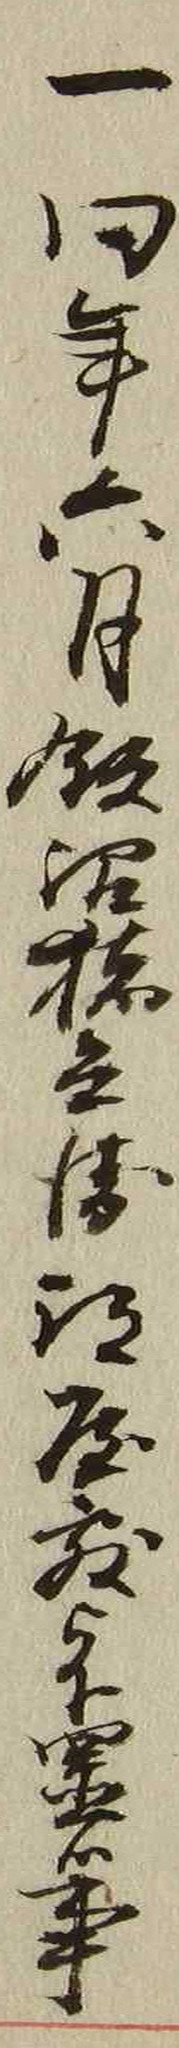一同年六月飯沼猪兵衛跡屋敷被下置候事
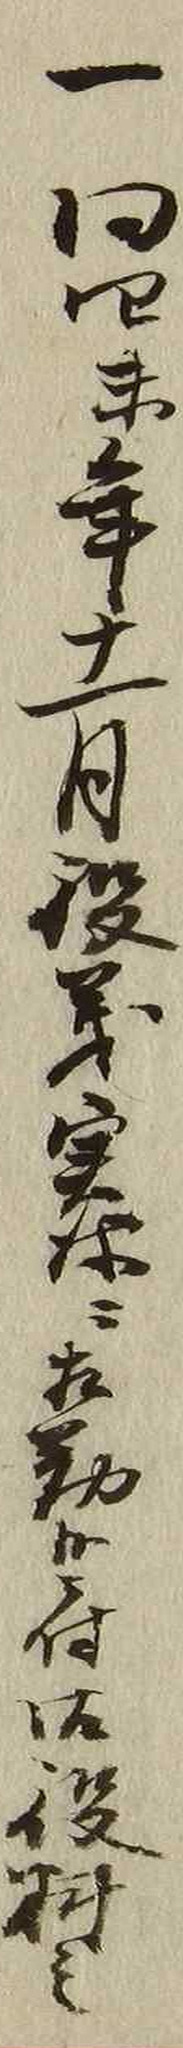一同四未年十一月役義実体ニ相勤候ニ付御役料之
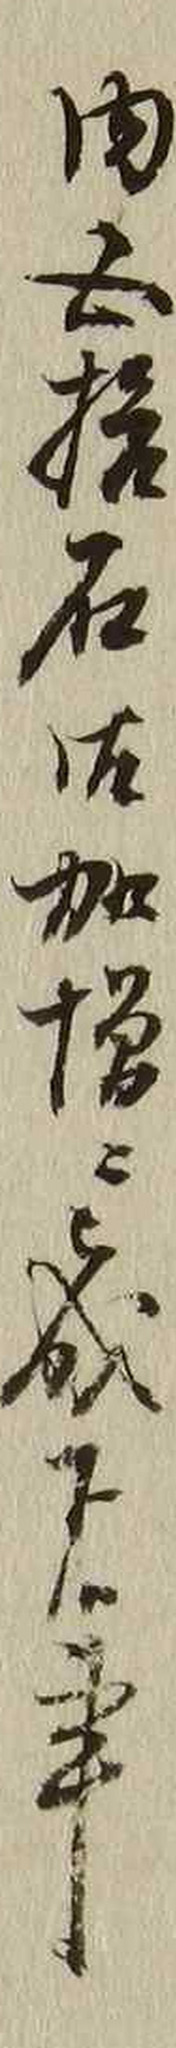内五拾石御加増ニ被成下候事
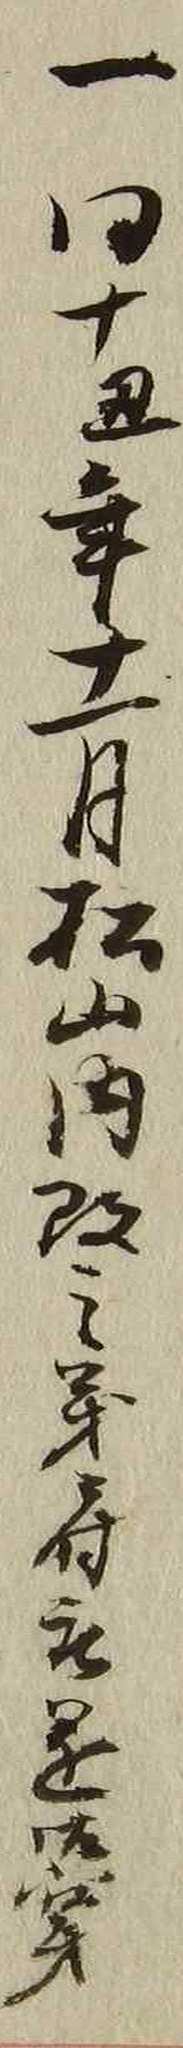一同十丑年十月松山内改之義ニ付被懸御穿
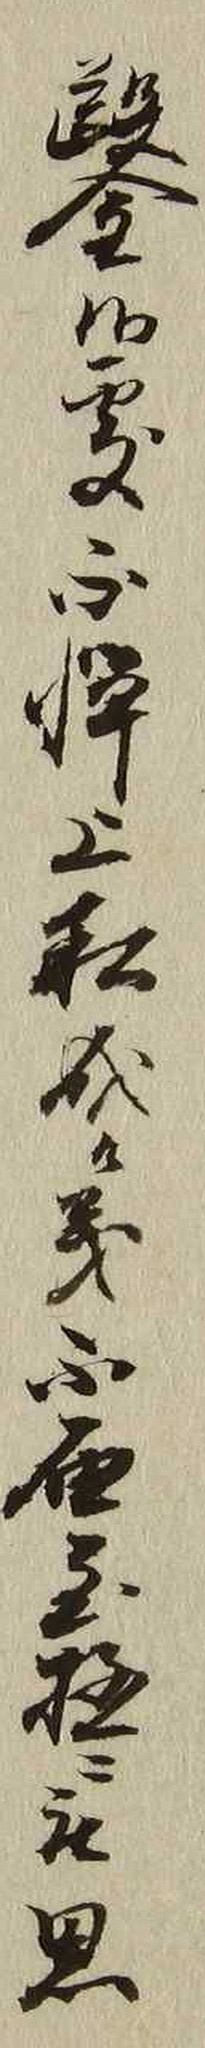鑿金候処不憚上私成ル義不届至極ニ被思
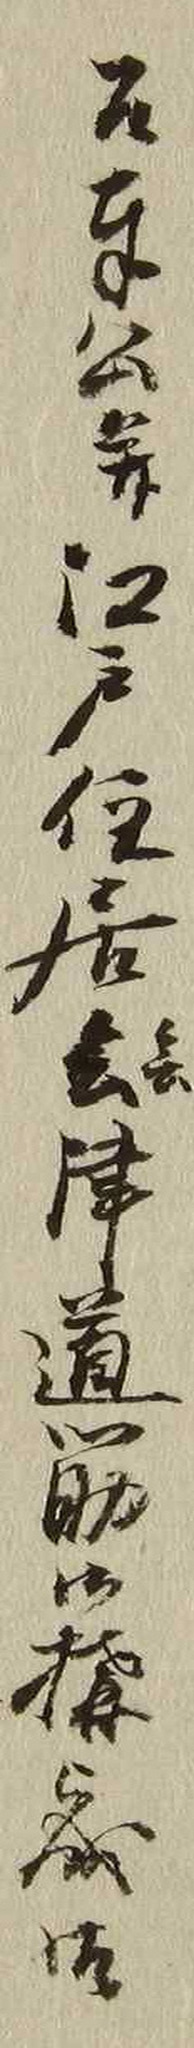召奉公并江戸住居会津道筋御構被成御
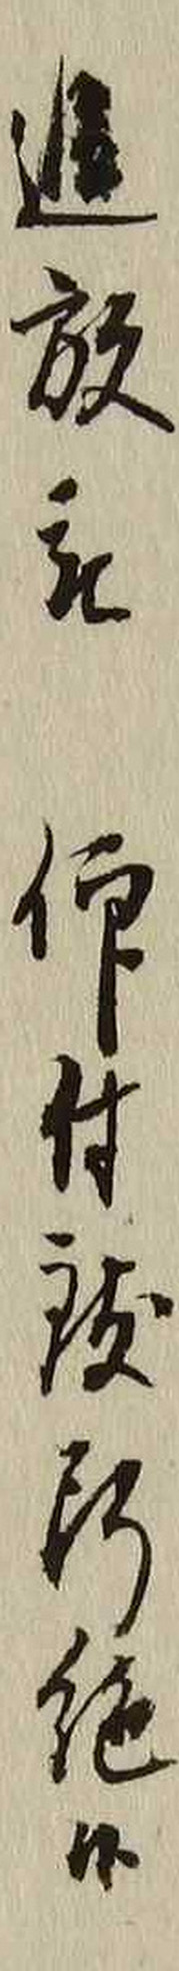追放被仰付致断絶候
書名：諸士系譜　巻之349　も之部5
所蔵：会津若松市立会津図書館
